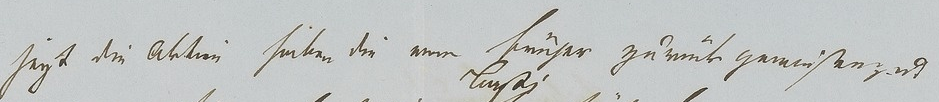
jezt die Aktien haben die man früher zurück gewiesen; u.
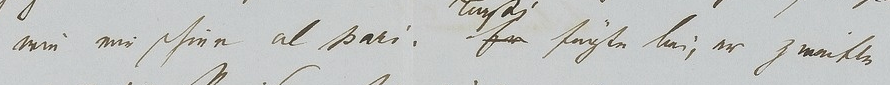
wie mir schien al pari. ...Baßi fügte bei, er zweifle
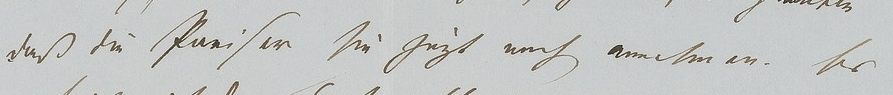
daß die Pariser sie jezt noch annehmen. Es
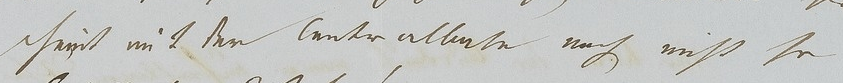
scheint mit der Centralbahn noch nicht so
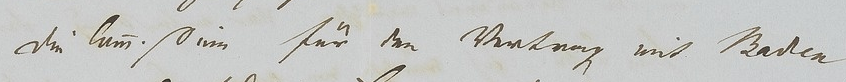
Die Commission für den Vertrag mit Baden
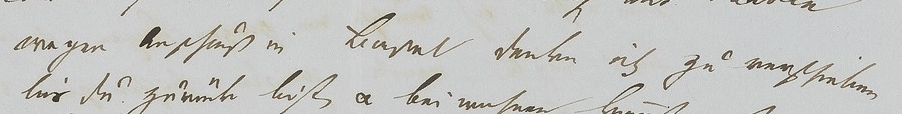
wegen Anschluß in Basel denke ich zu verschieben
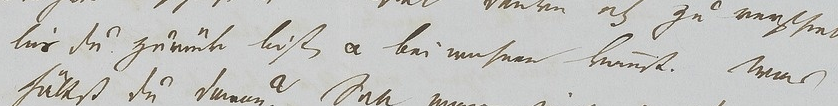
bis du zurück bist & beiwohnen kannst. Was
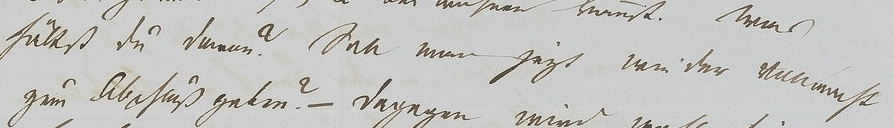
hältst du davon? Soll man jezt wieder Vollmacht
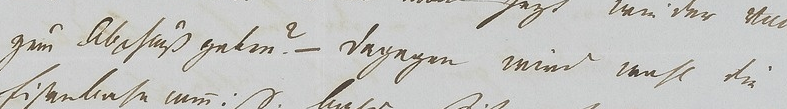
zum Abschluß geben? – Dagegen wird wohl die
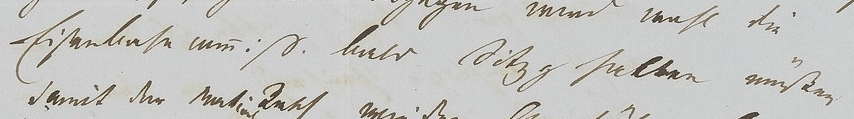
Eisenbahncommiss. bald Sitzung halten müßen
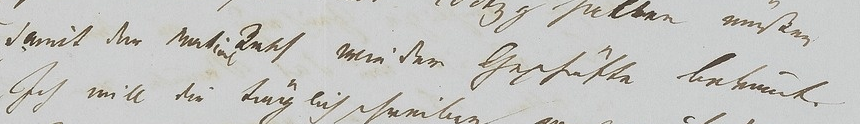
damit der National Rath wieder Geschäfte bekommt.
